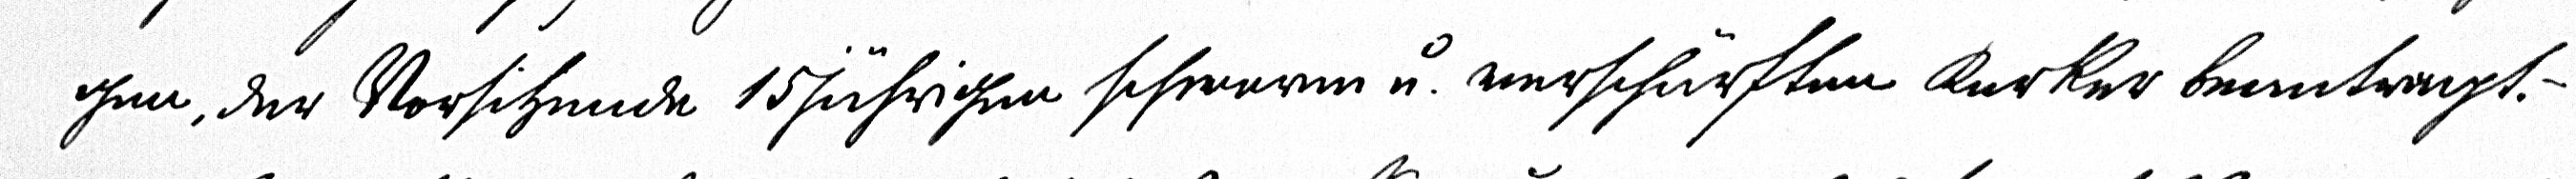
gen, der Vorsitzende 15jährigen schweren u. verschärften Kerker beantragt.-
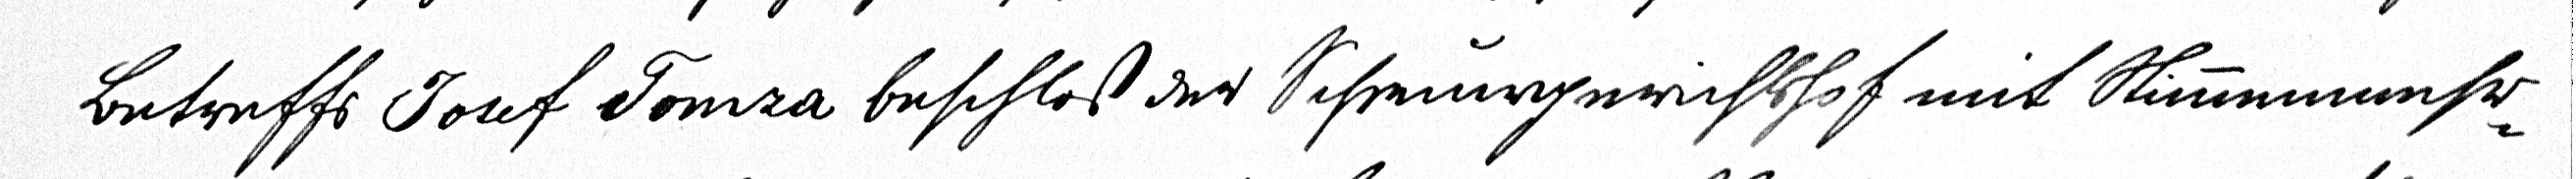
Betreffs Josef Tomza beschlos der Schwurgerichtshof mit Stimmenmehr¬
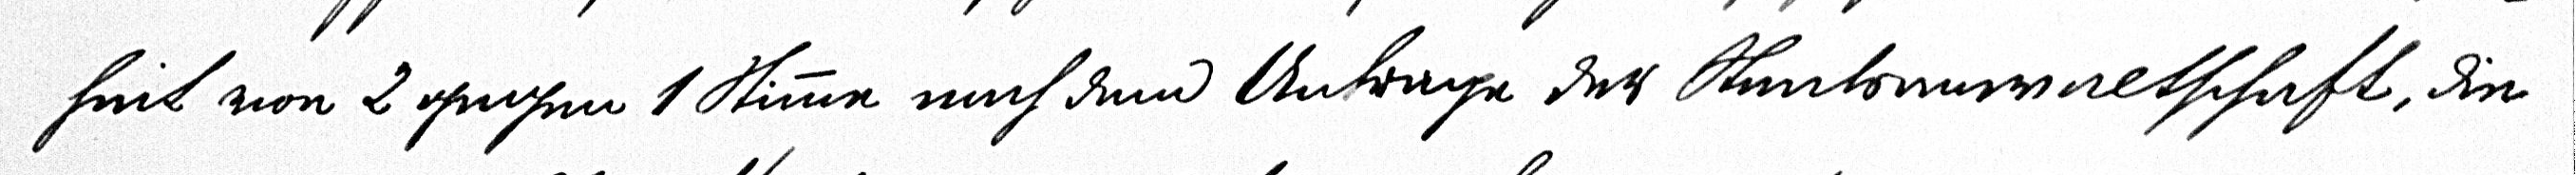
heit von 2 gegen 1 Stimme nach den Antrage der Staatsanwaltschaft, die
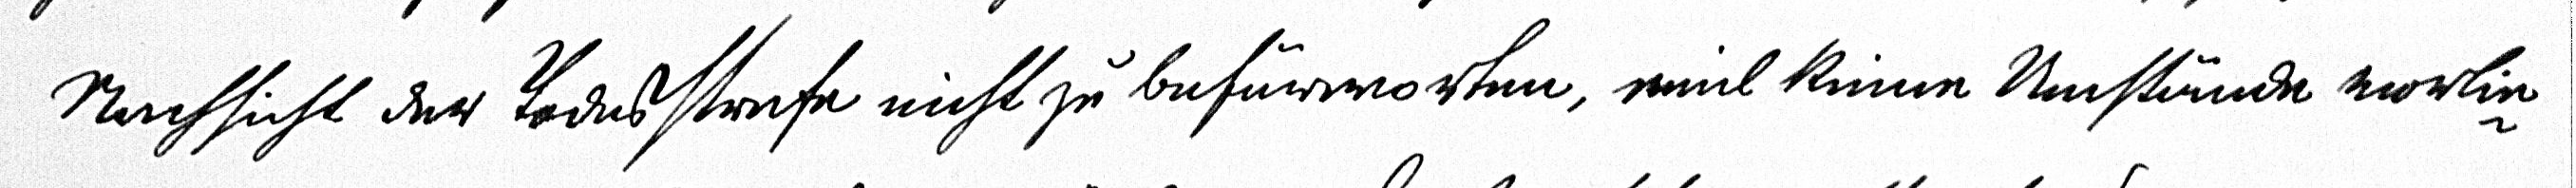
Nachsicht der Todesstrafe nicht zu befürworten, weil keine Umstände vorlie¬
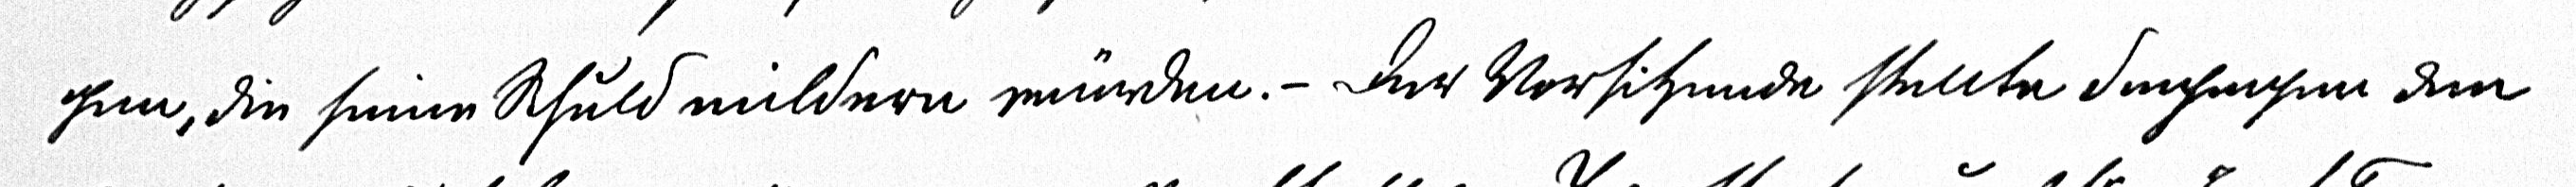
gen, die seine Schuld mildern würden.- Der Vorsitzende stellte dagegen den
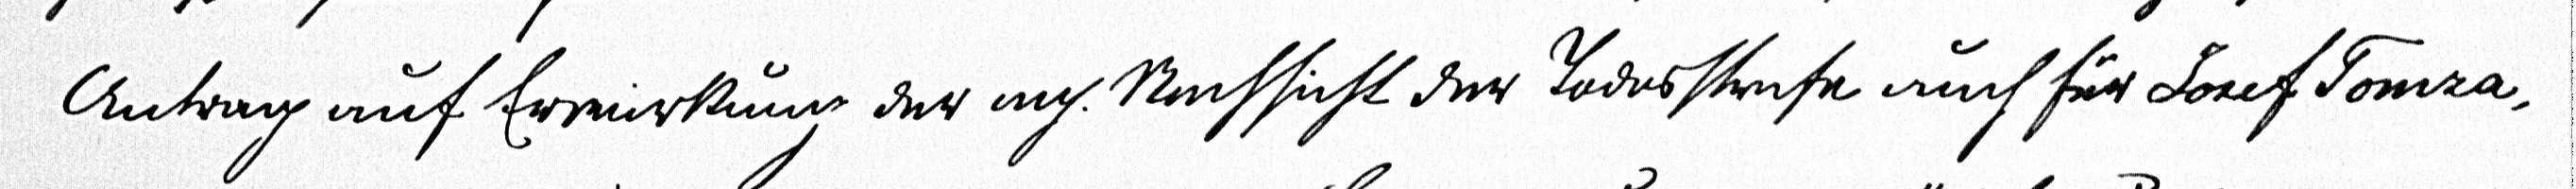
Antrag auf Erwirkung der xx. Nachsicht der Todesstrafe auch für Josef Tomza,
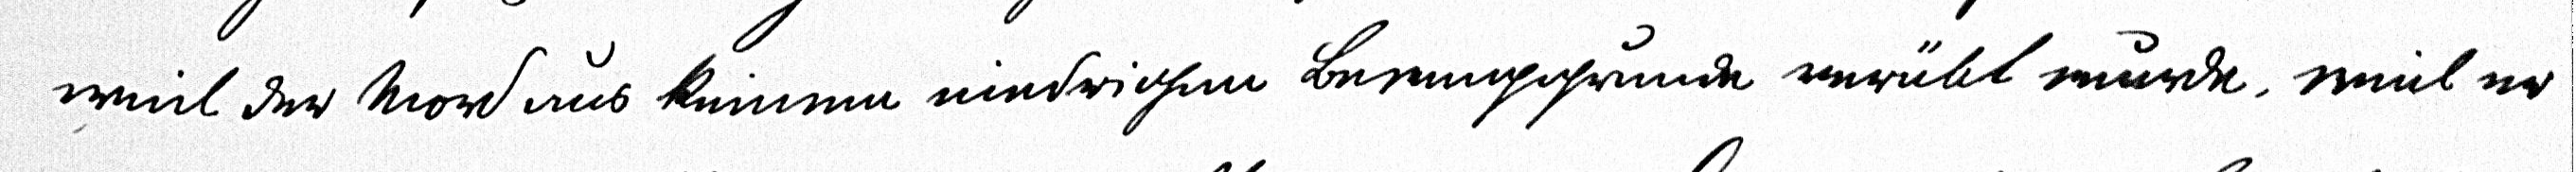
weil der Mord aus keinem eindrigen Beweggrunde verübt wurde, weil er
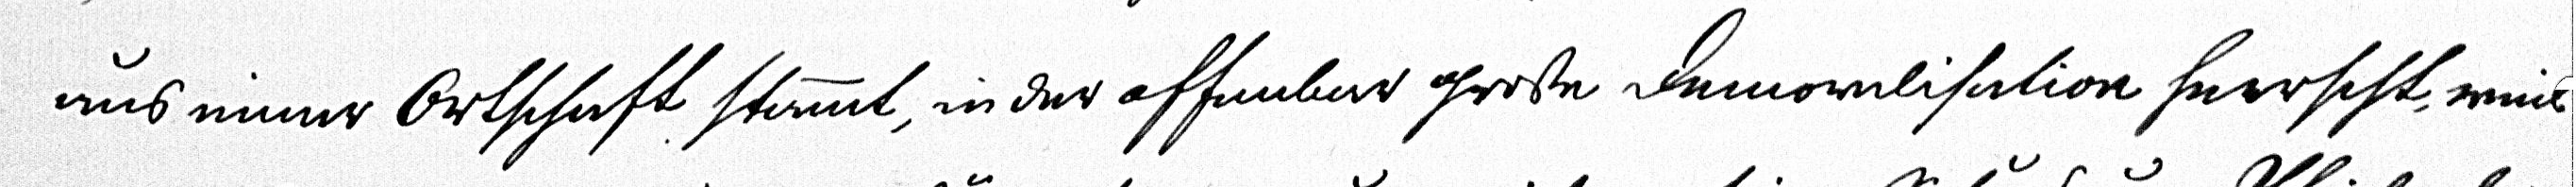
aus einer Ortschaft stammt, in der offenbar große Demoralisation herrscht, weil
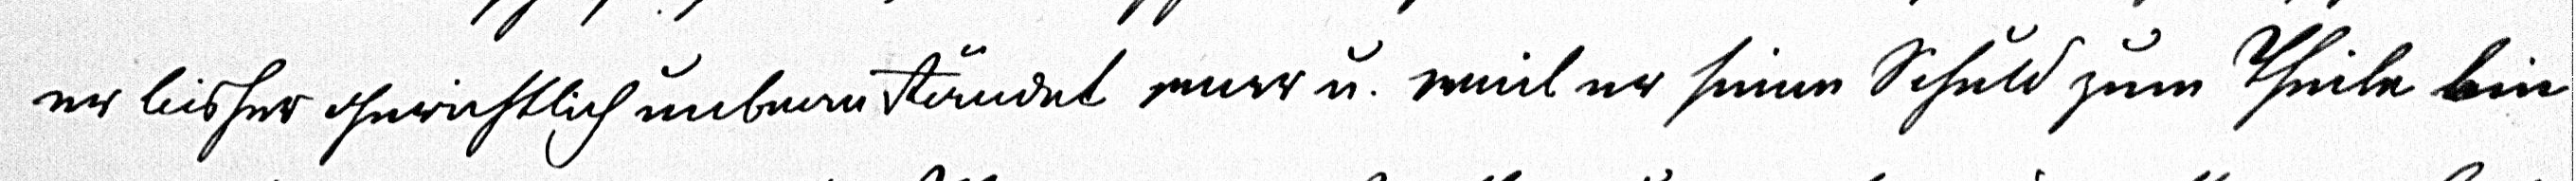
er bisher gerichtlich unbeanständet war u. weil er seine Schuld zum Theile bin
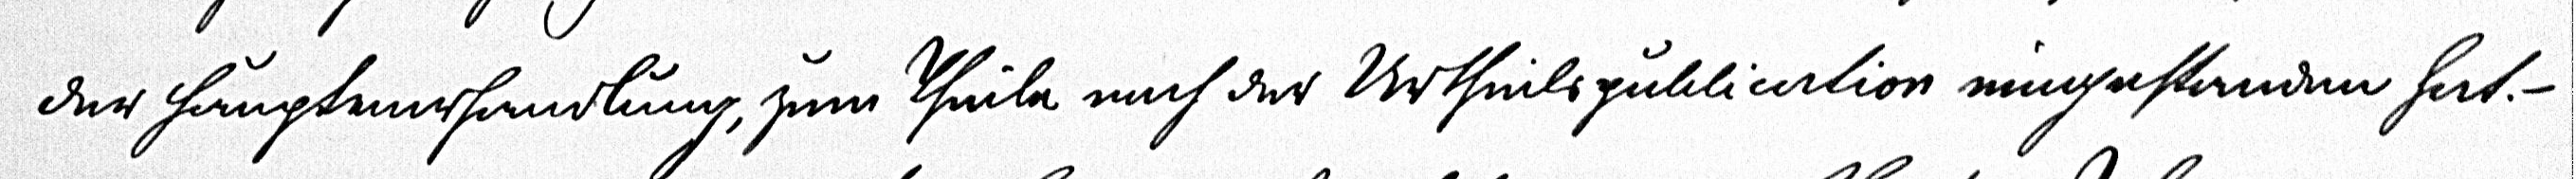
der Hauptverhandlung, zum Theile nach der Urtheilspublication eingestanden hat.-
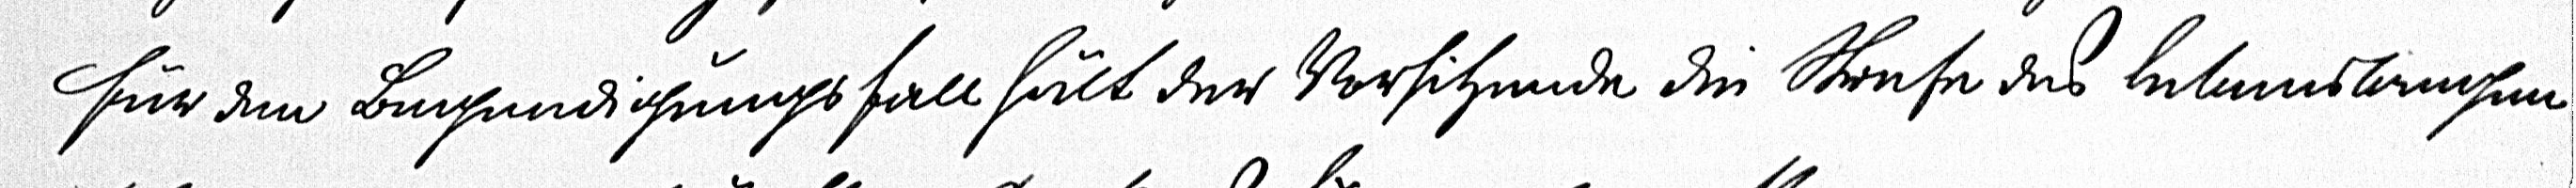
Für den Begandigungsfall hält der Vorsitzende die Strafe des lebensbangen
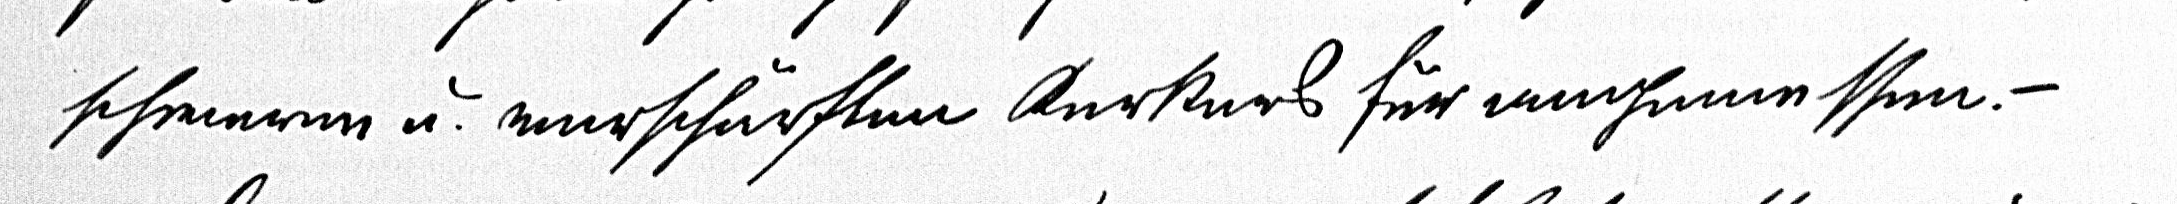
schweren u. verschärften Kerkers für angemessen.-
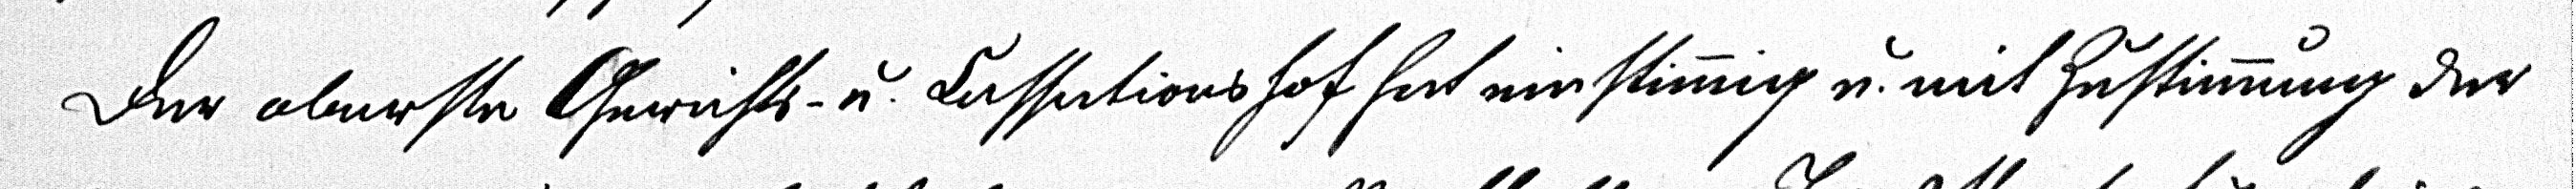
Der oberste Gerichts- u. Cassationshof hat einstimmig u. mit Zustimmung der
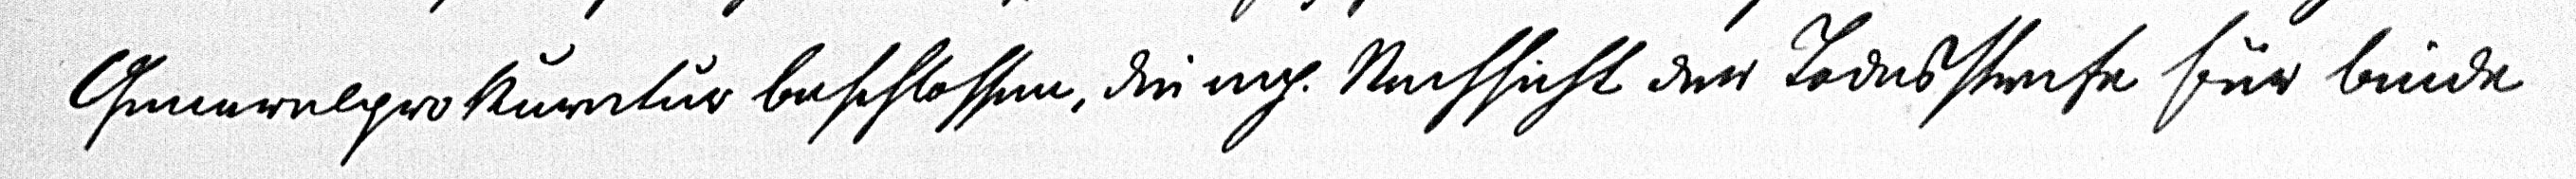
Generalprokuratur beschlossen, die xx Nachsicht der Todesstrafe für beide
